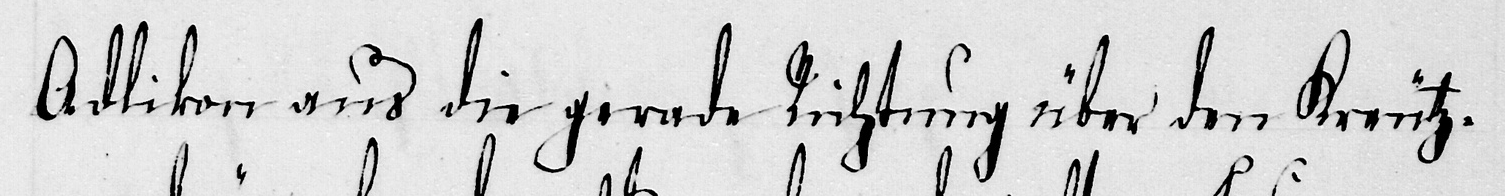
Adlikon aus die gerade Richtung über den Kreutz¬
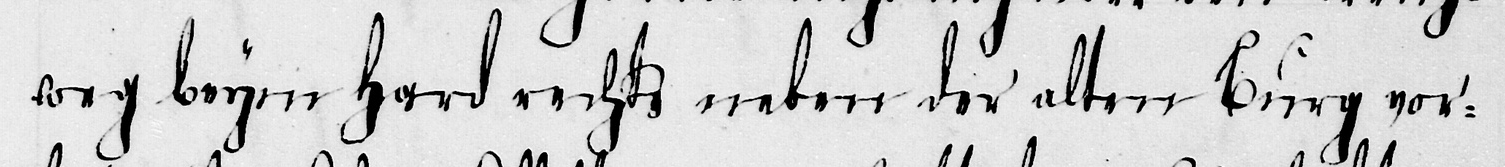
weg beym Hard rechts neben der alten Burg vor¬
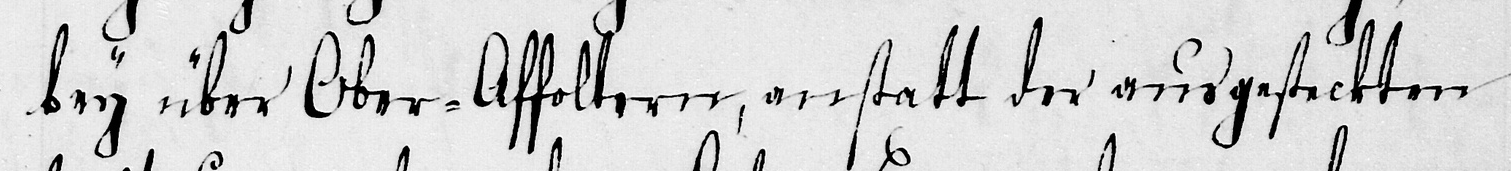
bey über Ober-Affoltern, anstatt der ausgesteckten
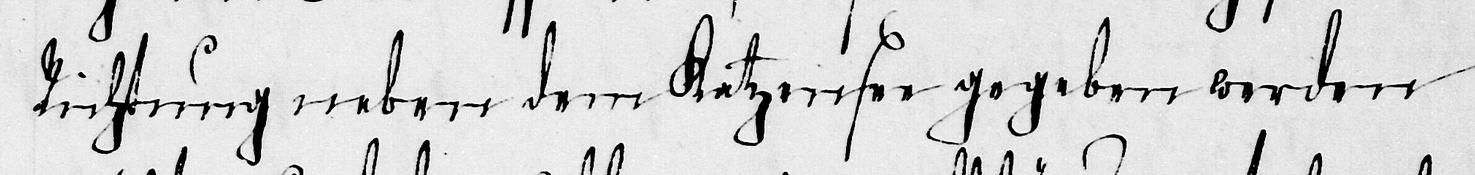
Richtung neben dem Katzensee gegeben werden
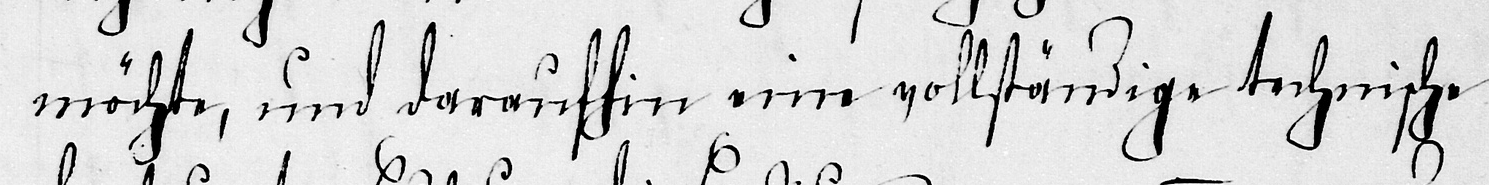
möchte, und daraufhin eine vollständige technische
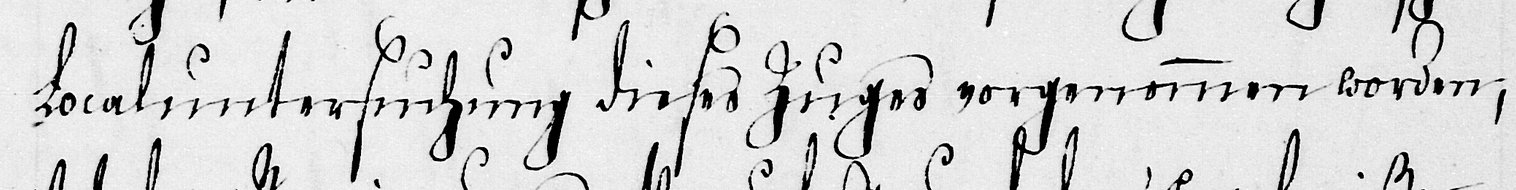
Localuntersuchung dieses Zuges vorgenommen worden,
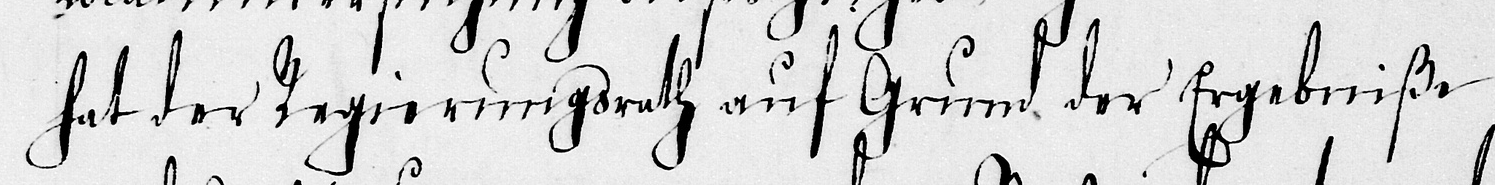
hat der Regierungsrath auf Grund der Ergebniße
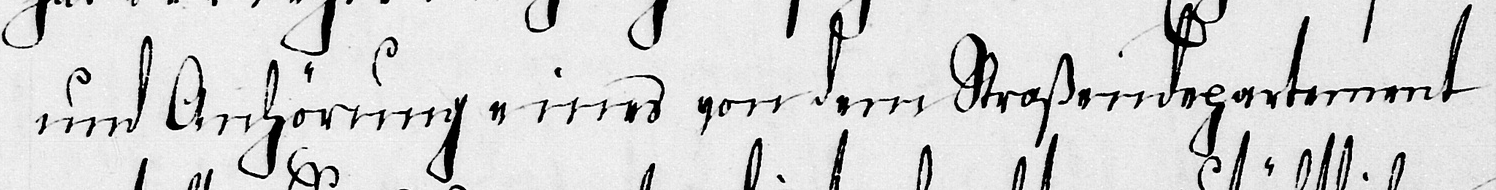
und Anhörung eines von dem Straßendepartement
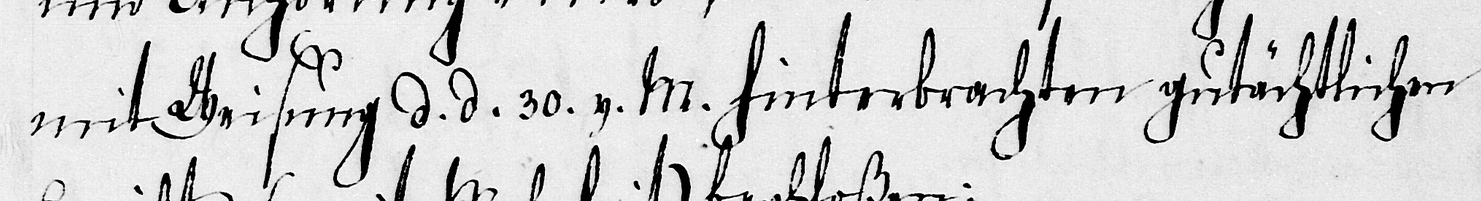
mit Weisung d. d. 30. v. M. hinterbrachten gutächtlichen
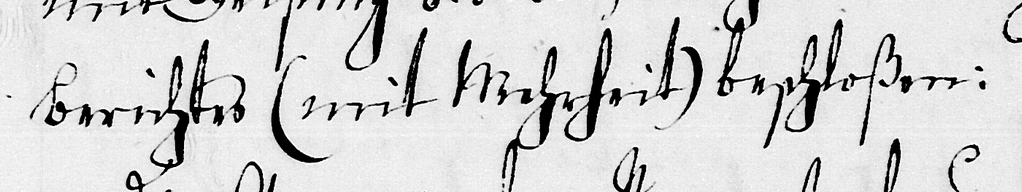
Berichtes (mit Mehrheit) beschloßen:
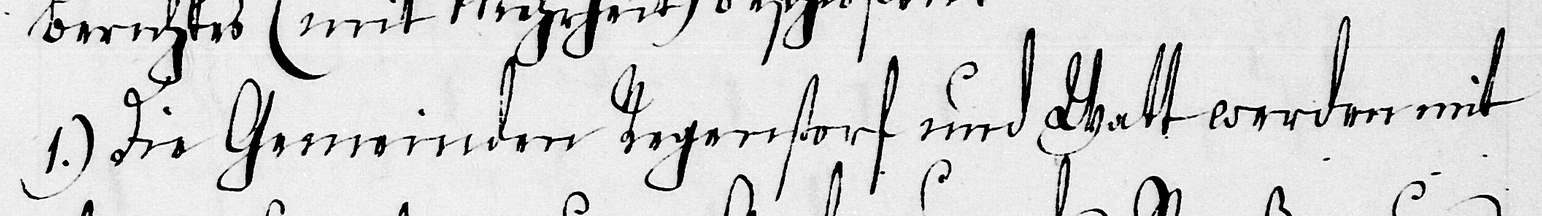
1.) Die Gemeinden Regenstorf und Watt werden mit
